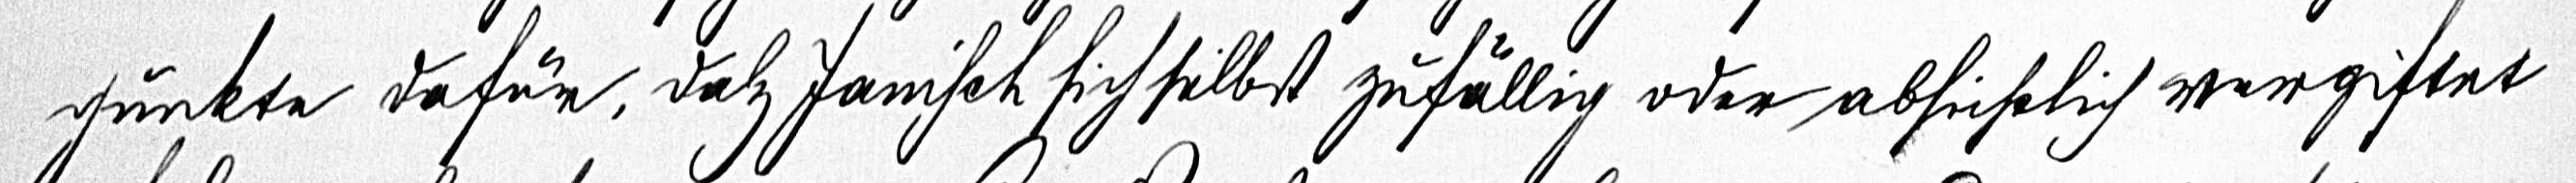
punkte dafür , daß Janisch sich selbst zufällig oder absichtlich vergiftet
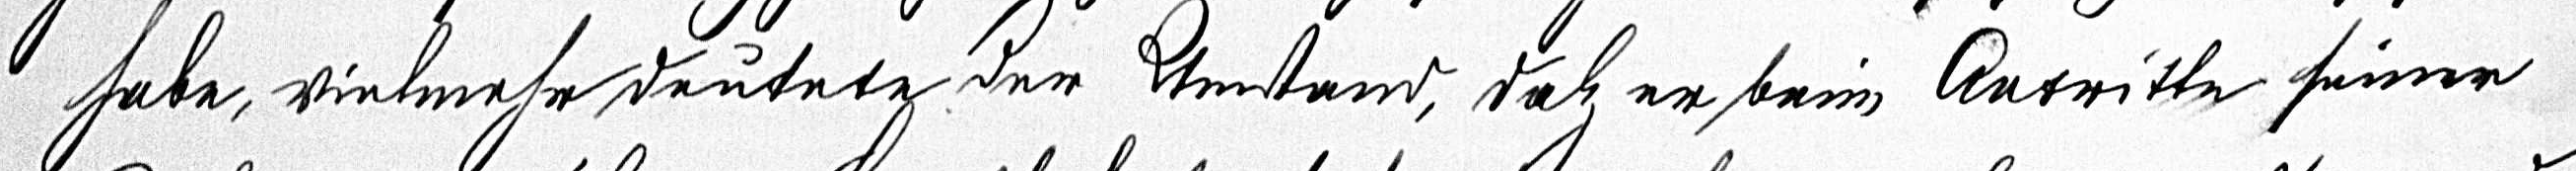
habe, vielmehr deutete der Umstand, daß er beim Antritte seiner
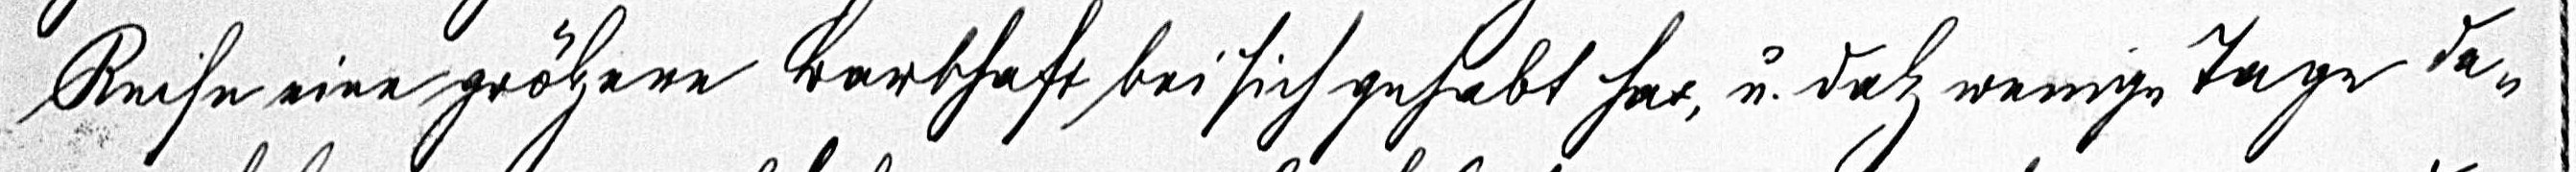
Reise eine größere Barschaft bei sich gehabt hat, u daß wenige Tage da¬
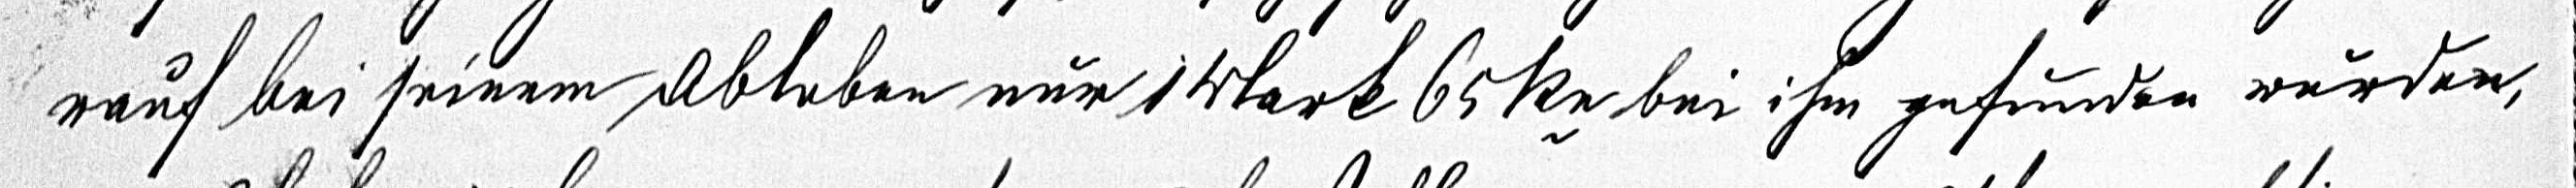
rauf bei seinem Ableben nur 1 Mark 65 Kr bei ihm gefunden wurden,
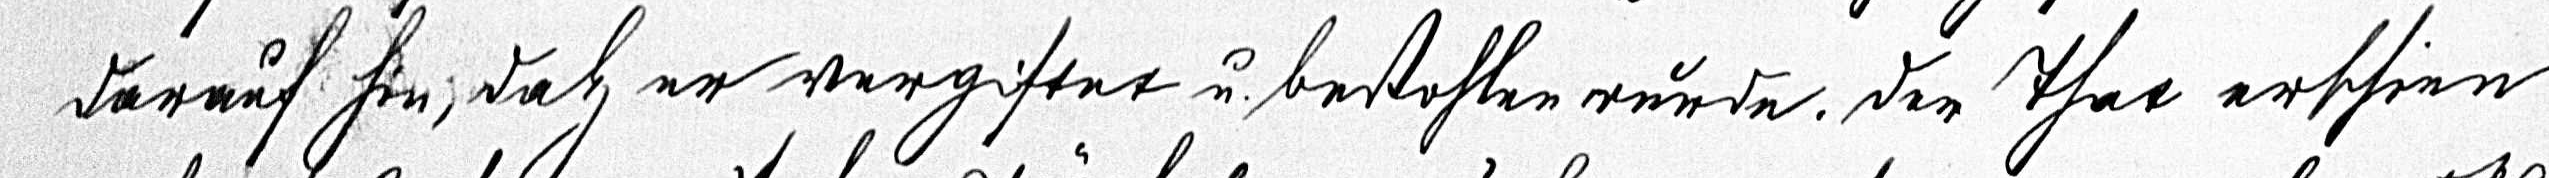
darauf hin, daß er vergiftet u bestohlen wurde. Der That erschien
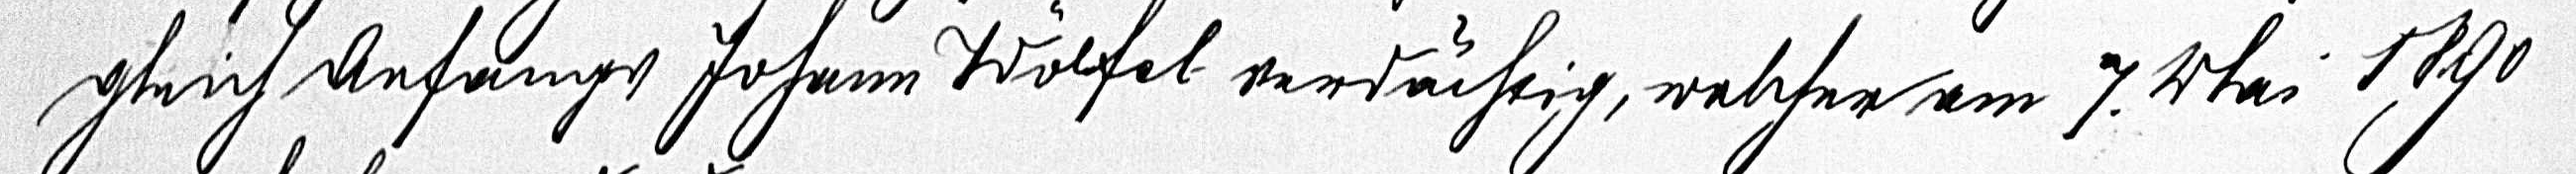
gleich Anfangs Johann Wölfel verdächtig, welcher am 7. Mai 1890
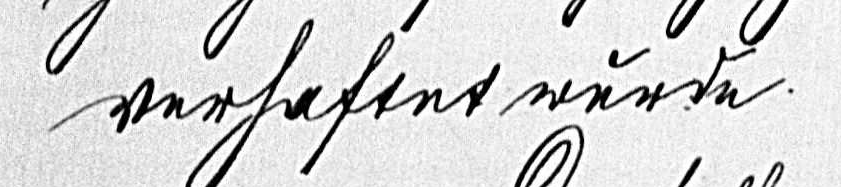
verhaftet wurde.
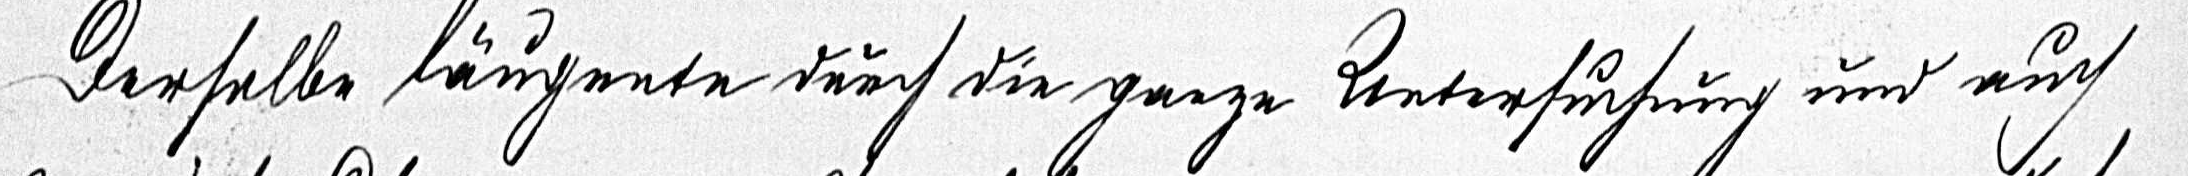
Derselbe läugnete durch die ganze Untersuchung und auch
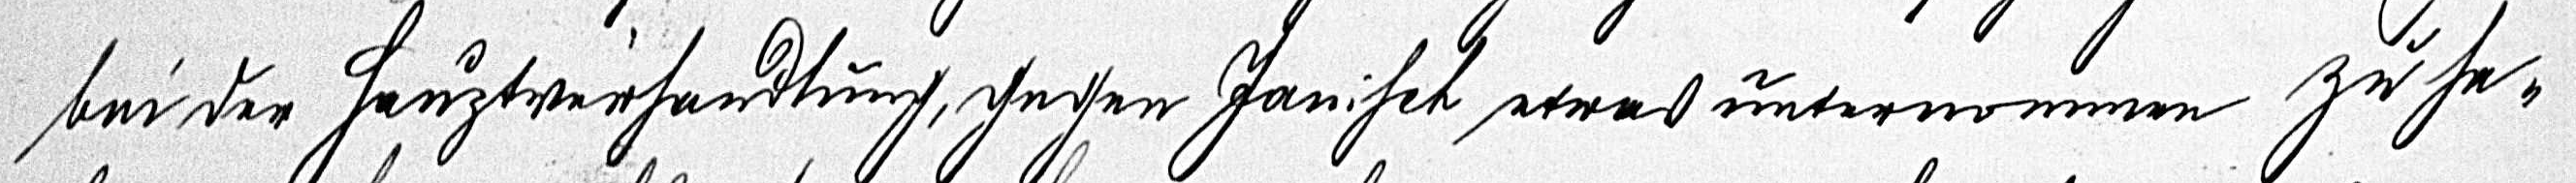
bei der Hauptverhandlung, gegen Janisch etwas unternommen zu ha¬
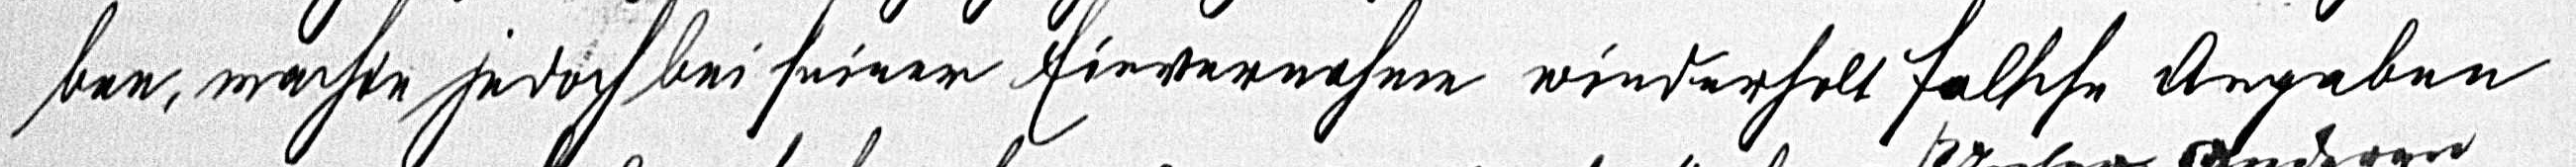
ben, machte jedoch bei seiner Einvernehme wiederholt falsche Angaben
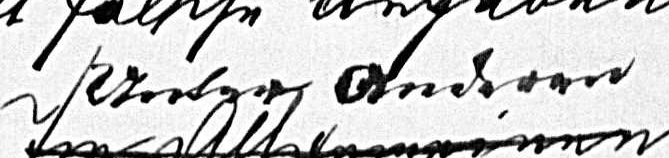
Unter Anderen
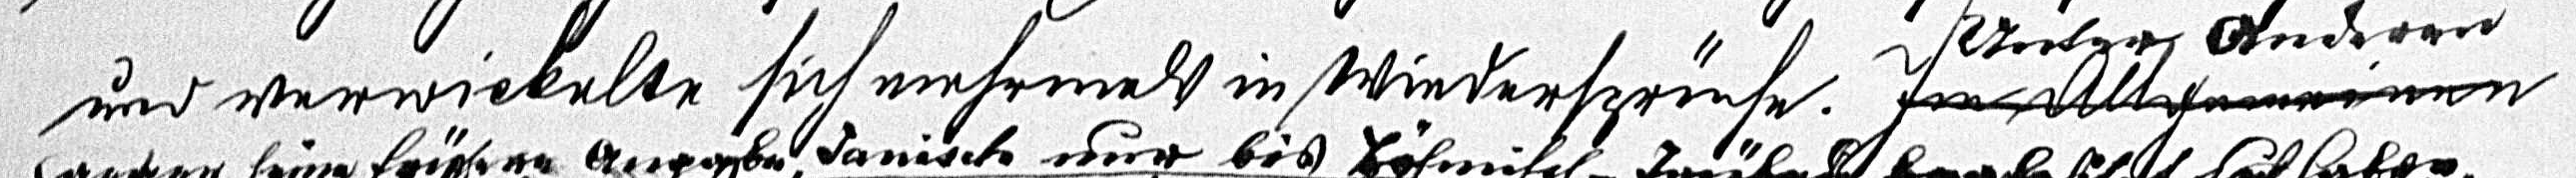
und verwickelte sich mehrmals in Wiedersprüche.
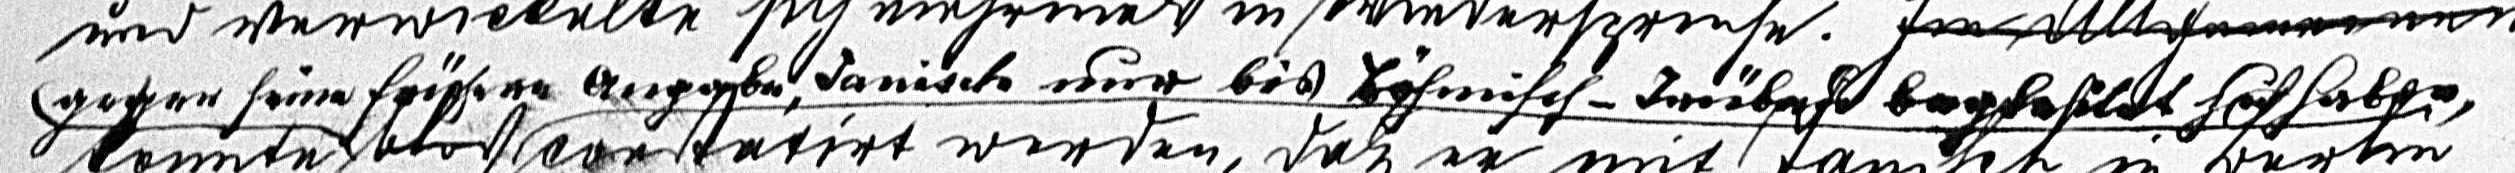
gegen seine frühere Angabe, Janisch nur bis Böhmisch-Trübau begleitet zu haben,
